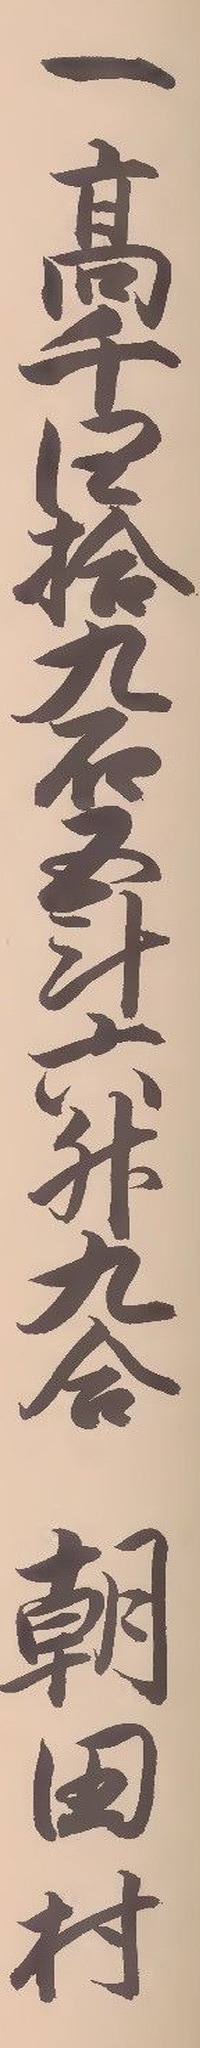一高千四拾九石五斗六升九合朝田村
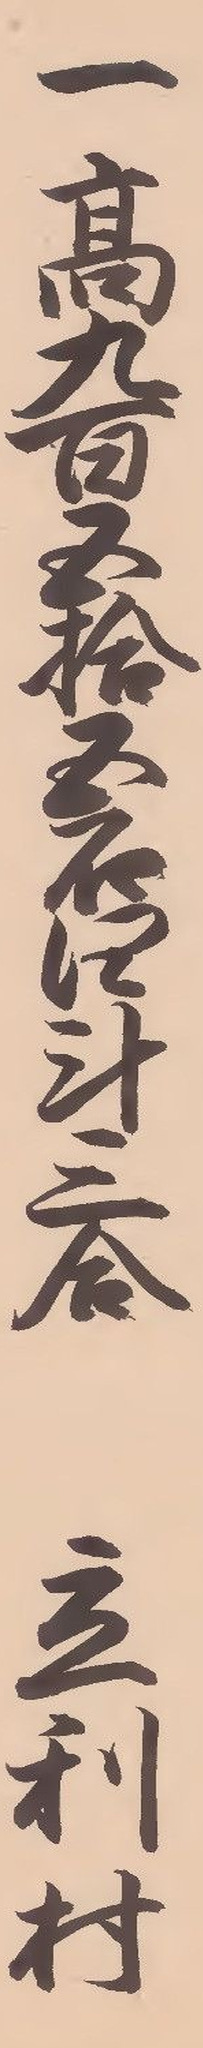一高九百五拾五石四斗三合立利村
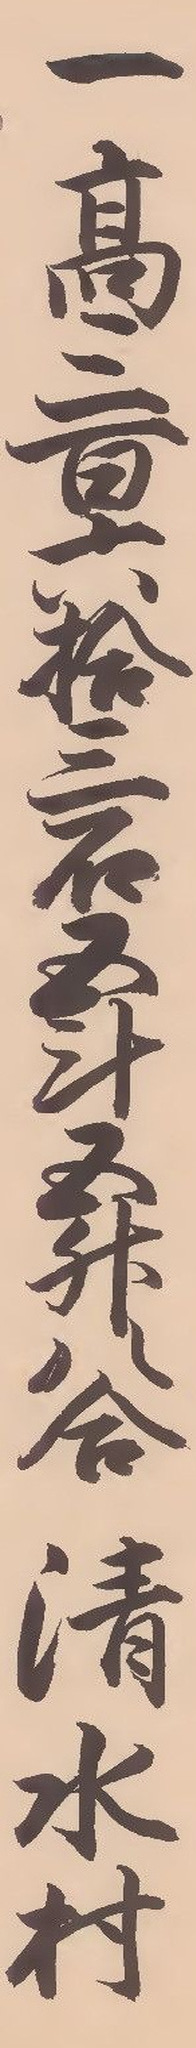一高三百六拾三石五斗五升八合清水村
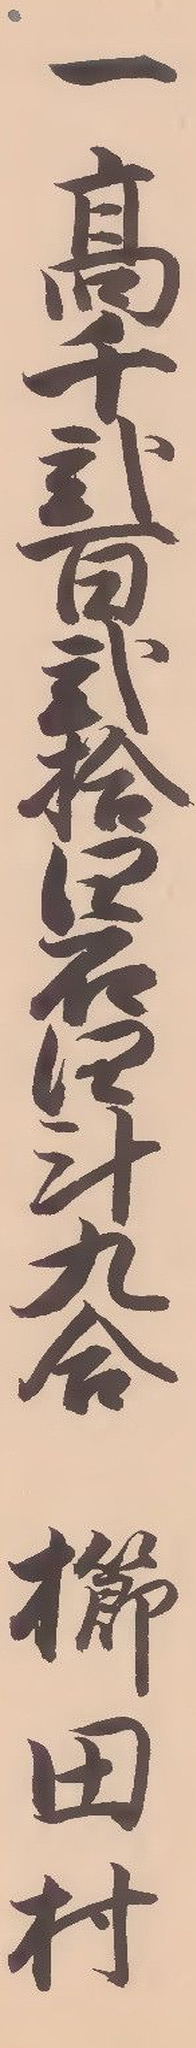一高千弐百弐拾四石四斗九合櫛田村

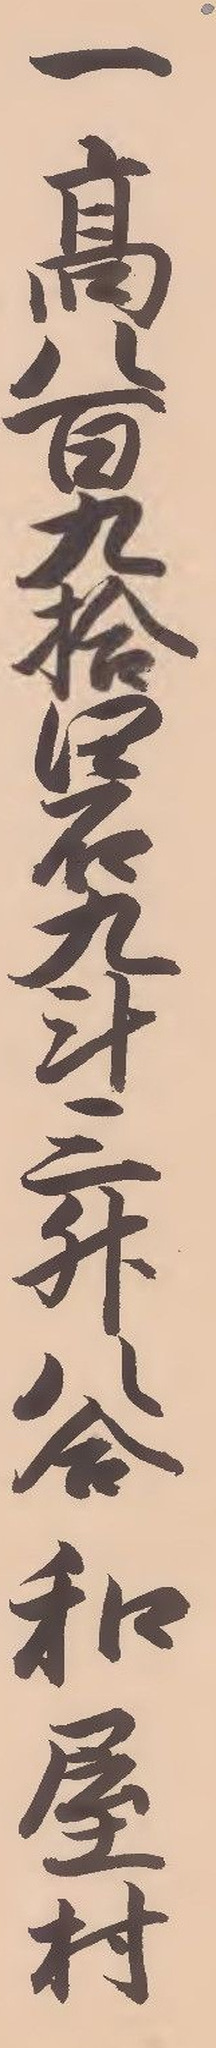一高八百九拾四石九斗三升八合和屋村
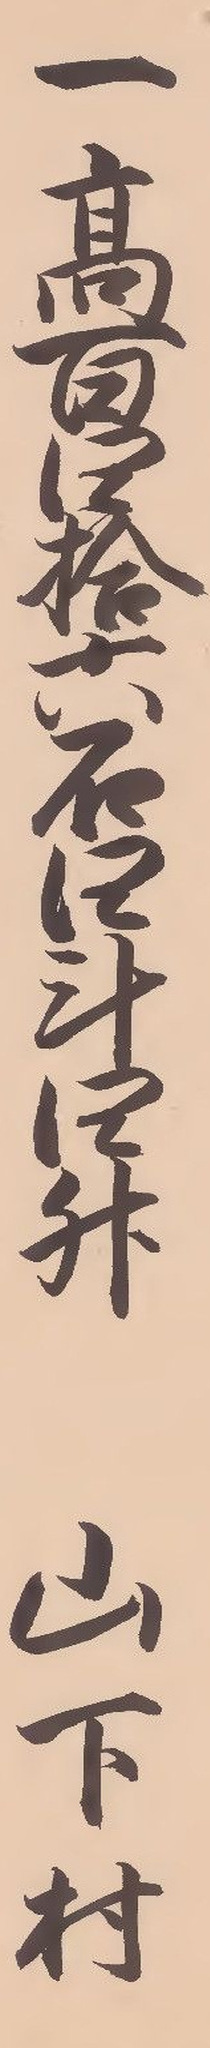一高百四拾六石四斗四升山下村
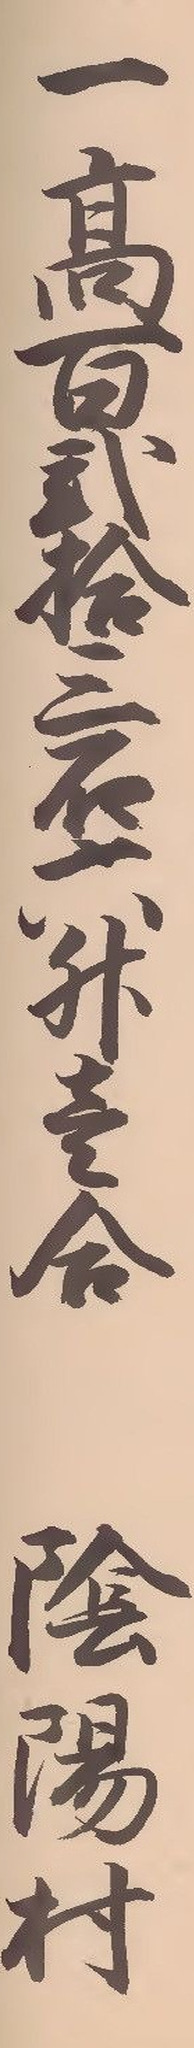一高百弐拾三石六升壱合陰陽村
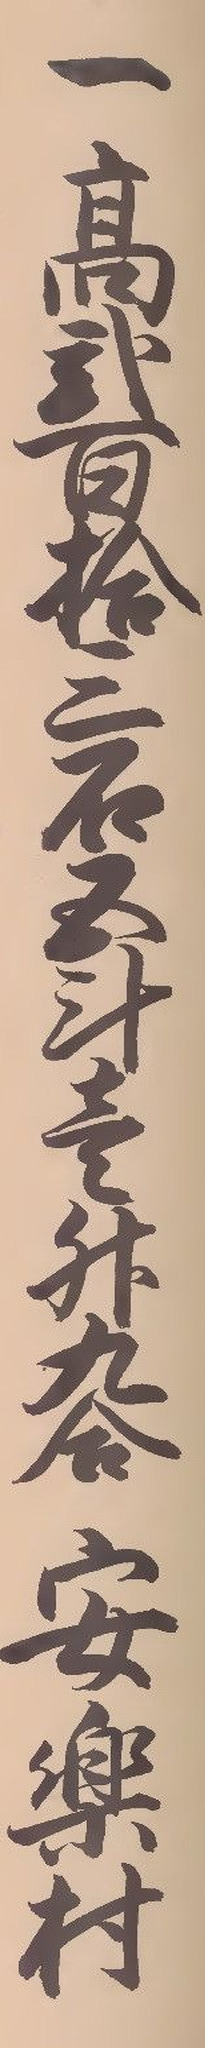一高弐百拾三石五斗壱升九合安楽村
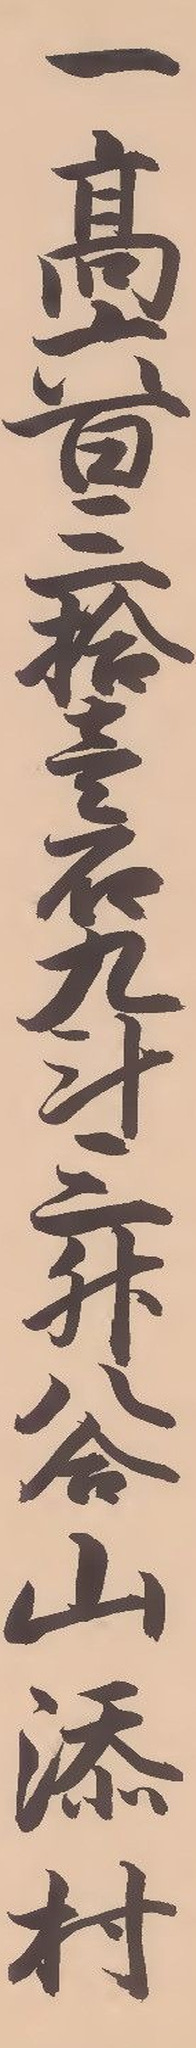一高六百三拾壱石九斗三升八合山添村
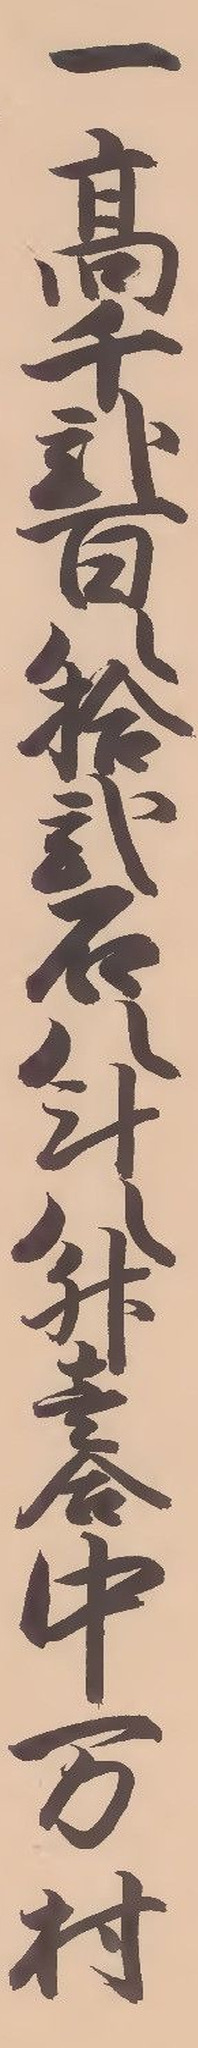一高千弐百八拾弐石八斗八升壱合中万村
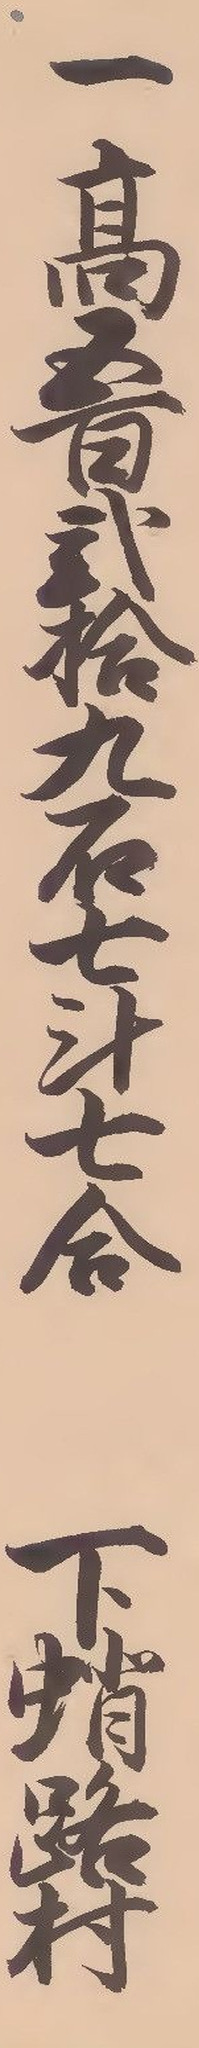一高五百弐拾九石七斗七合下蛸路村

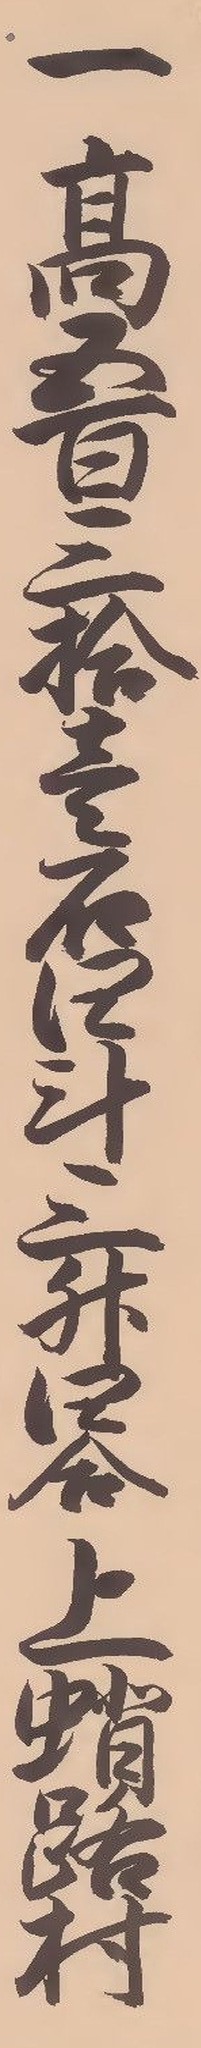一高五百三拾壱石四斗三升四合上蛸路村
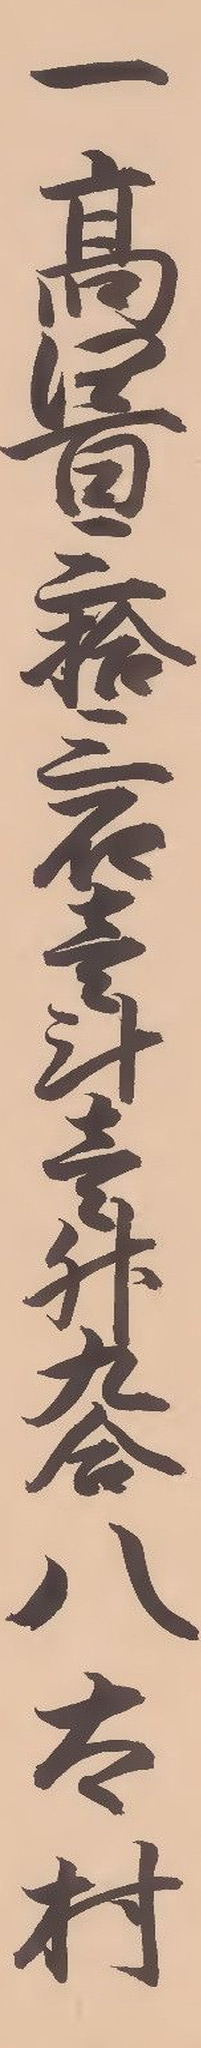一高四百三拾三石壱斗壱升九合八太村
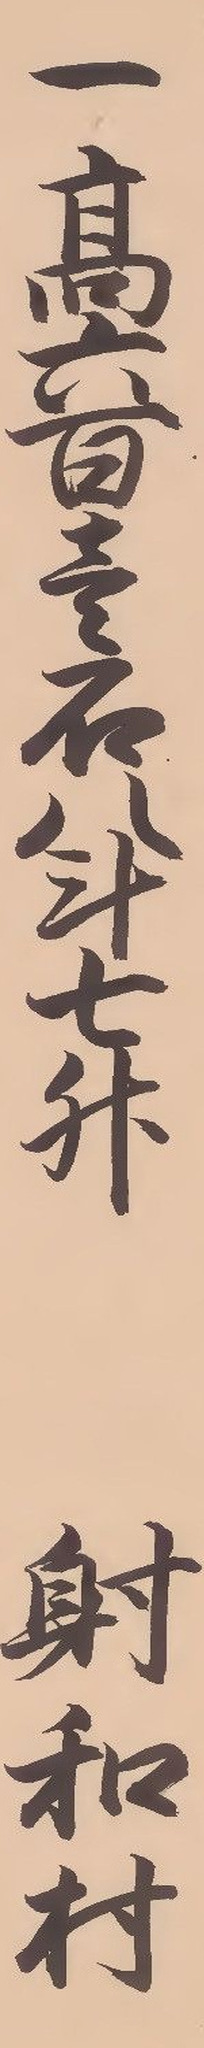一高六百壱石八斗七升射和村
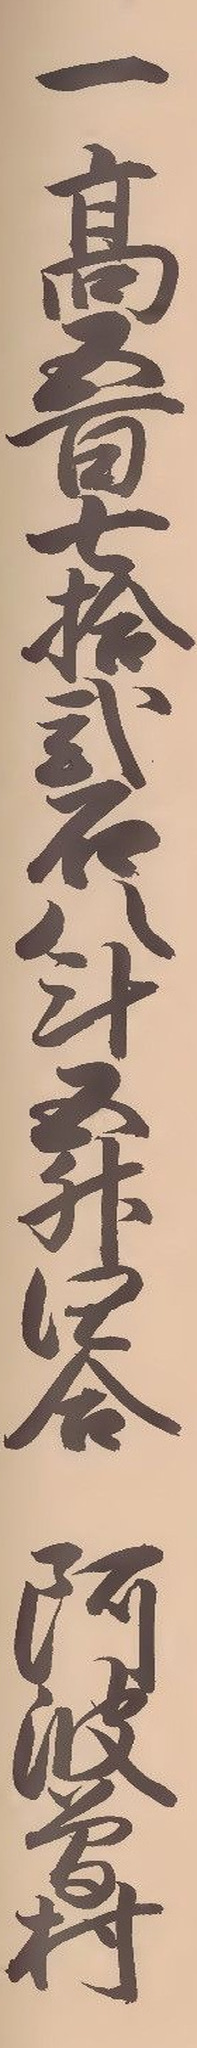一高五百七拾弐石八斗五升四合阿波曽村
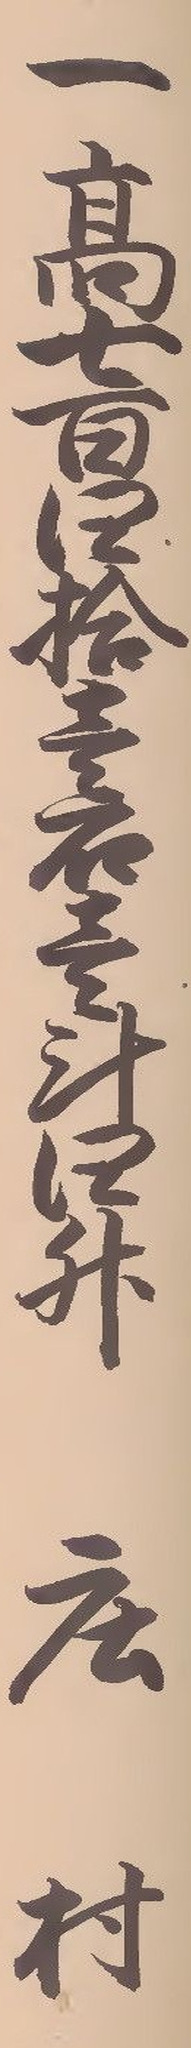一高七百四拾壱石壱斗四升庄村
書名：伊勢国郷帳
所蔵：国立公文書館 National Archives of Japan
